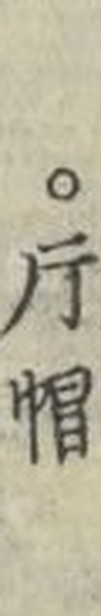◦片帽
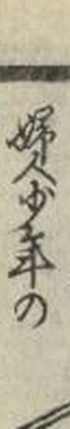婦人少年の
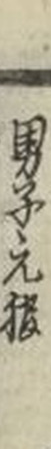男子元服
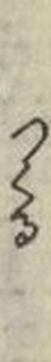つくる
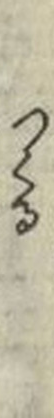つくる
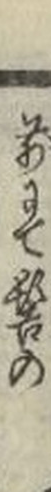前にて髻の
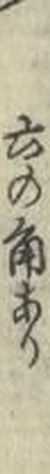六の角あり
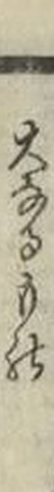大なるもの
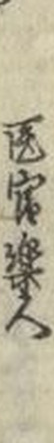医官楽人
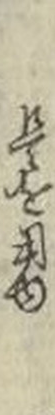是を用ゆ
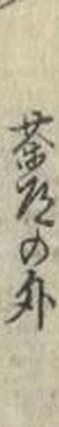茶道の外
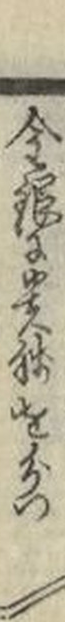金銀に貴賤を分つ
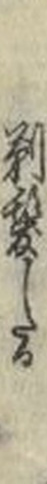剃髪したる
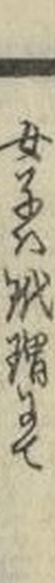女子は玳瑁にて
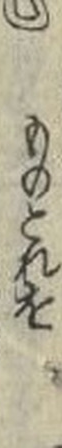ものこれを
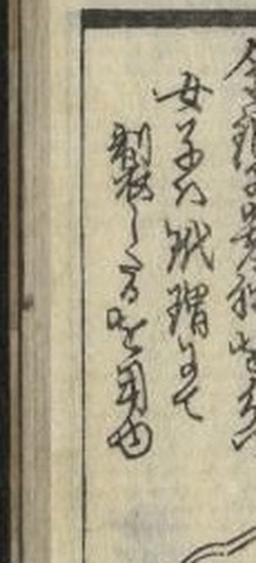製したるを用ゆ
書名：琉球解語
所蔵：University of the Ryukyus Library
